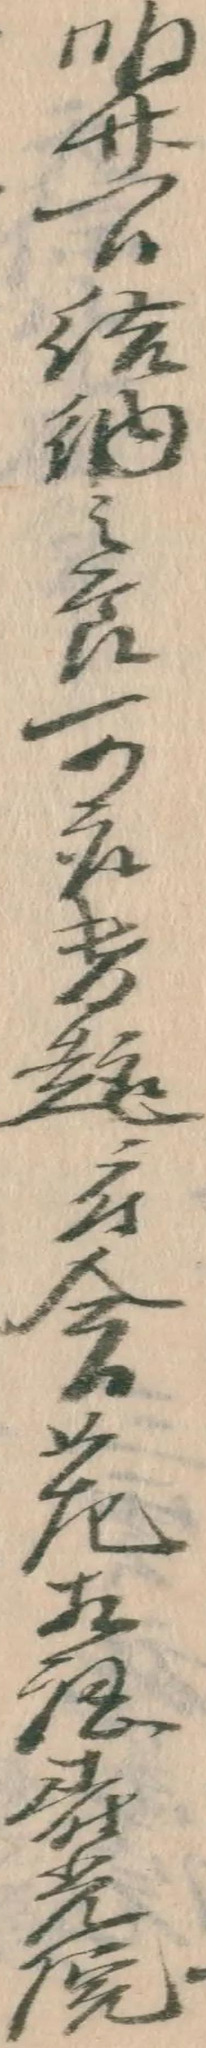明廿一日結納之節可取替趣ニ付今日如左相認壽光院
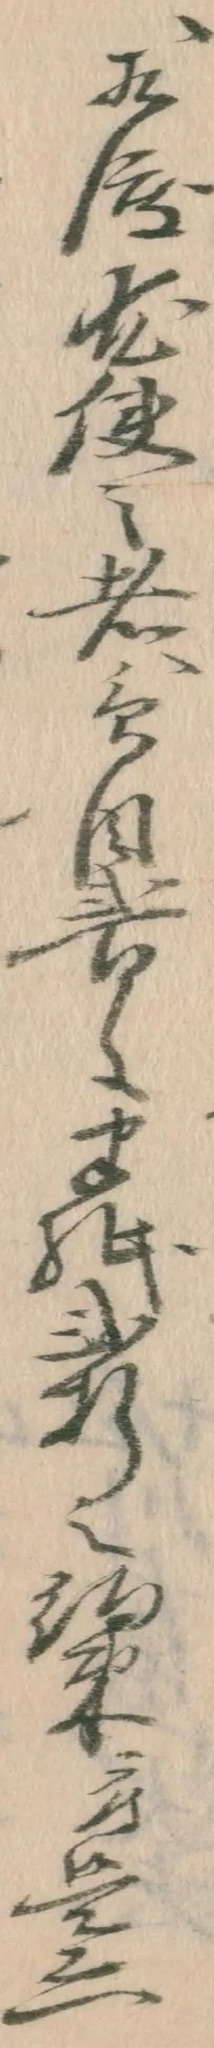ヘ相渡尤使之者へ鳥目弐百匁半紙弐軒之約束ニ付是ニ一
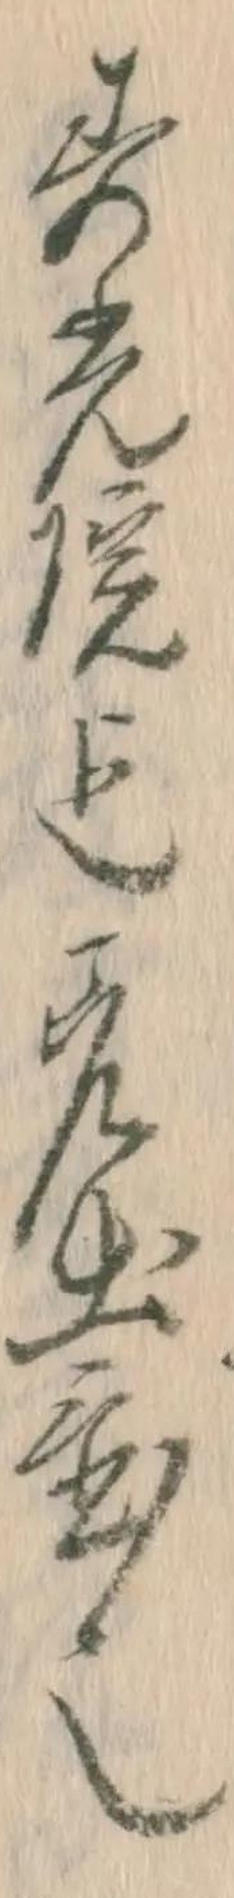壽光院迄差出置也

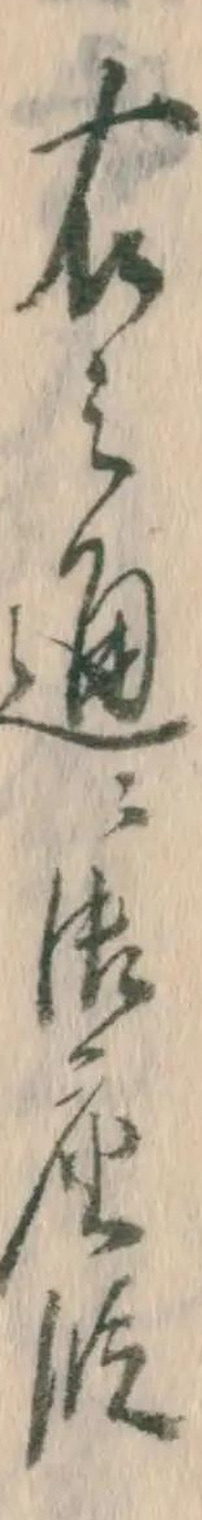右之通二御座候段
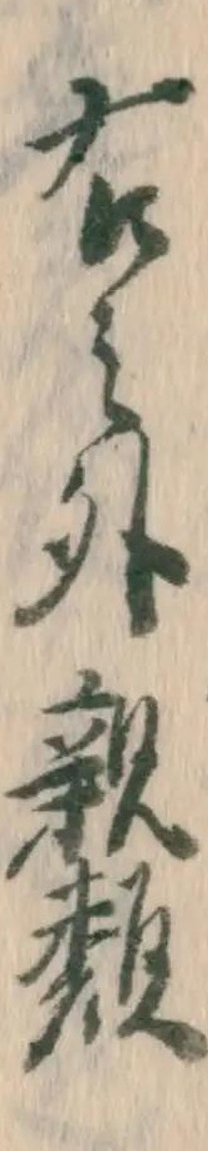右之外親類
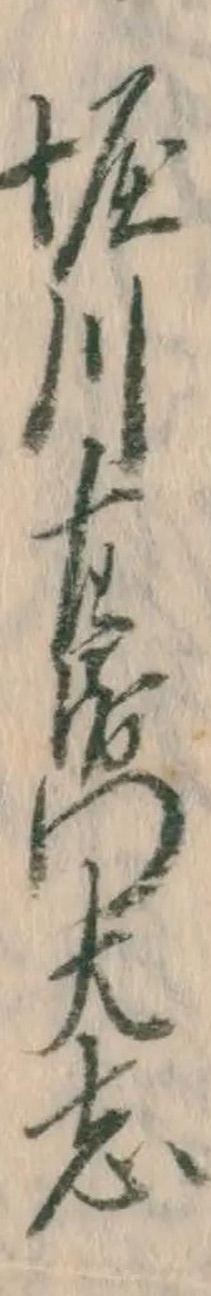一堀川左衛門大志
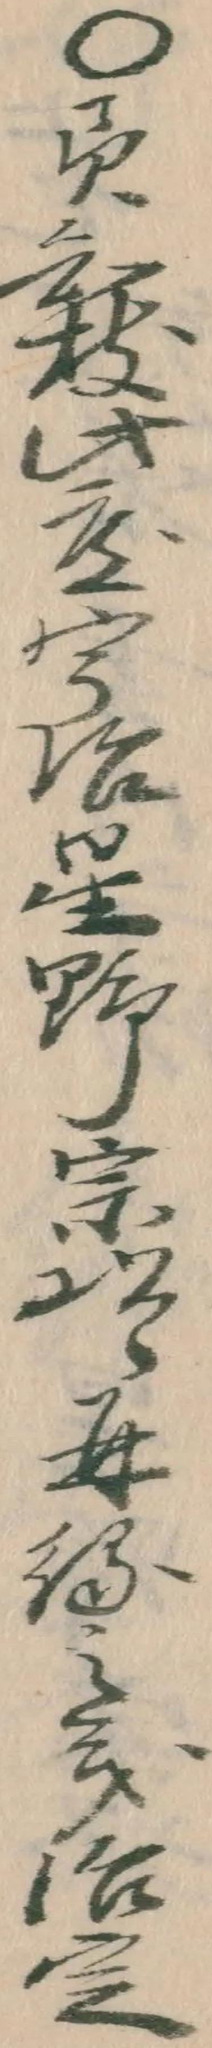○美知枝此度宇治星野宗以日再縁之義治定
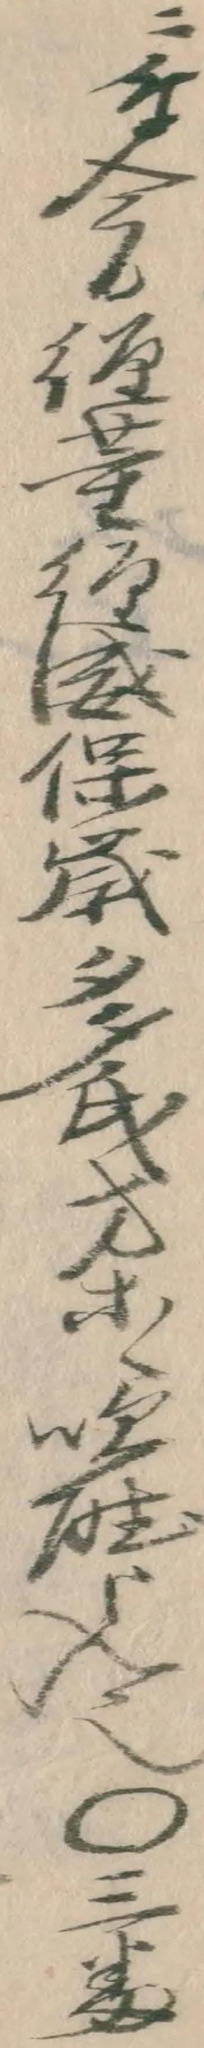ニ付今日経董経威保歳多氏方等へ吹聴申入也○三番
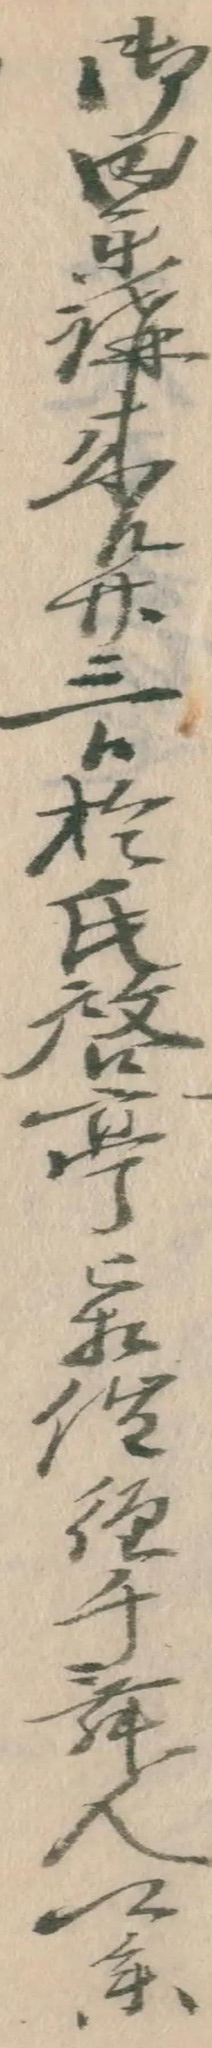御田楽講来ル廿三日於氏啓亭被相催経千舞人以参
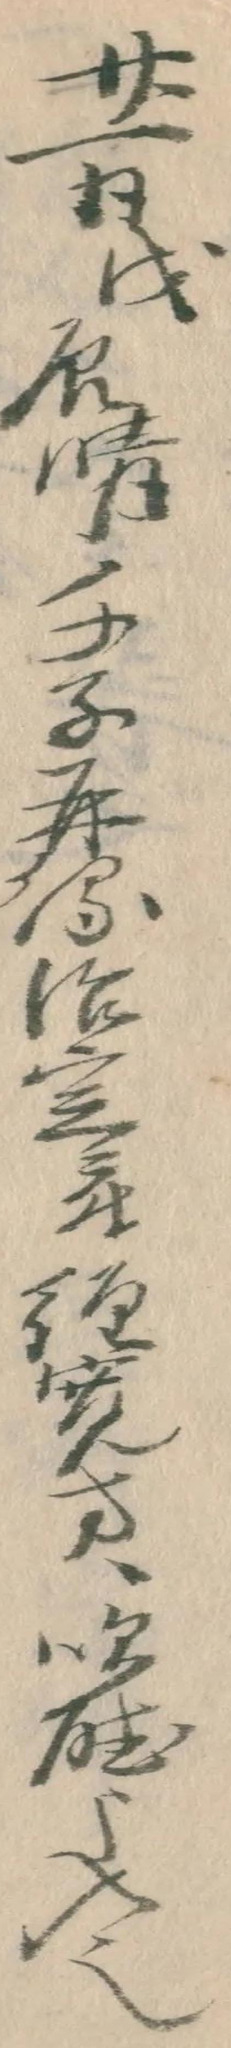廿一日戊辰晴千子再縁治ニ付経寛方へ吹聴申入也
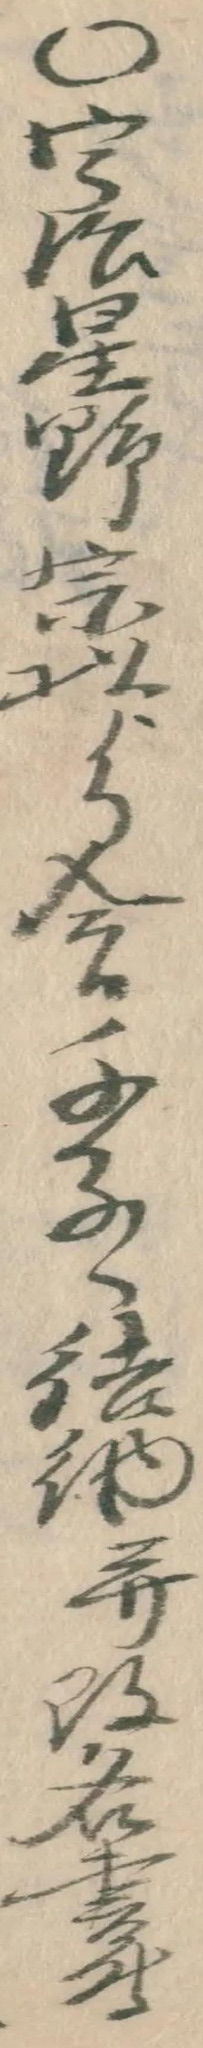○宇治星野宗以より今日千子へ結納并改名書付
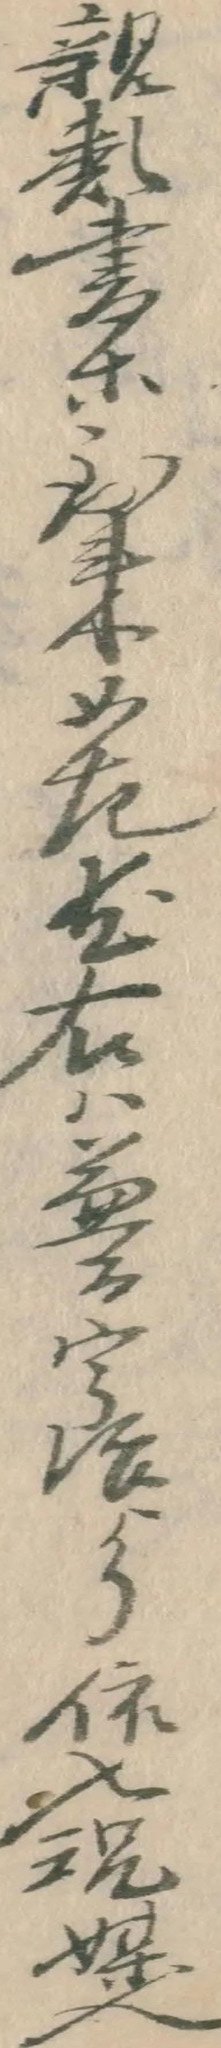親類書等到来如左尤右ハ兼而宇治より依入魂媒人
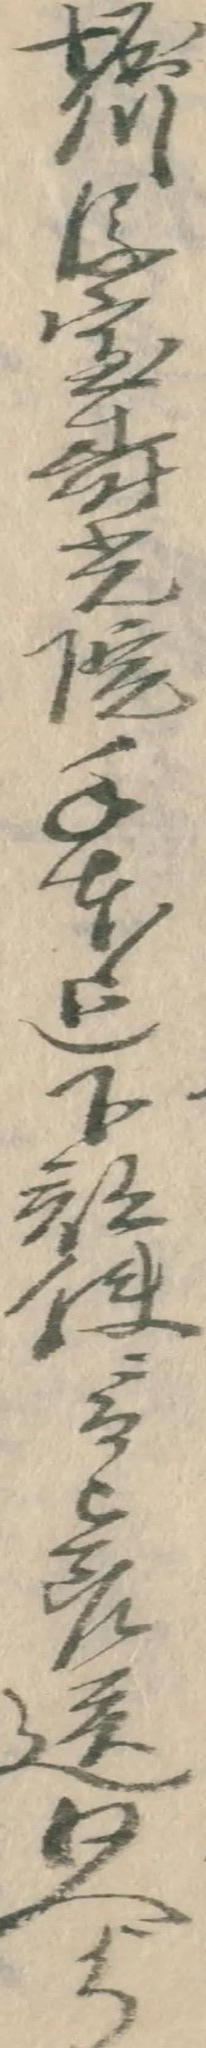堀川後宝壽光院手本迄下部使ニ而被差送同人より
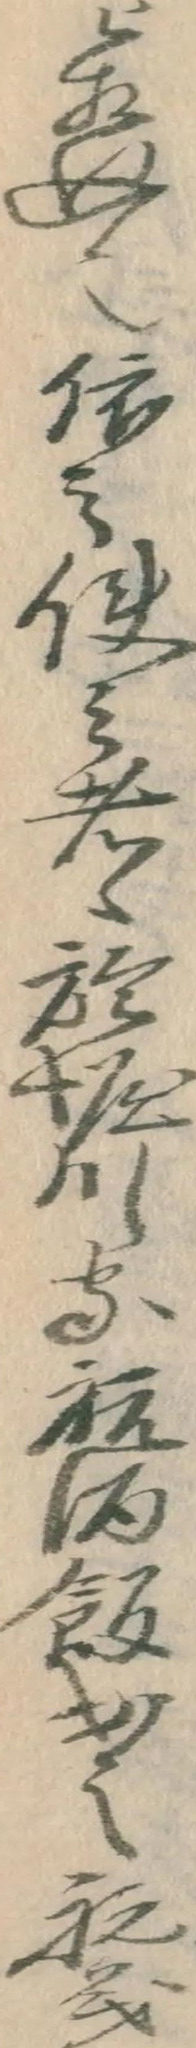被相廻也依之使之者へ於堀川守祝酒飯出之祝義

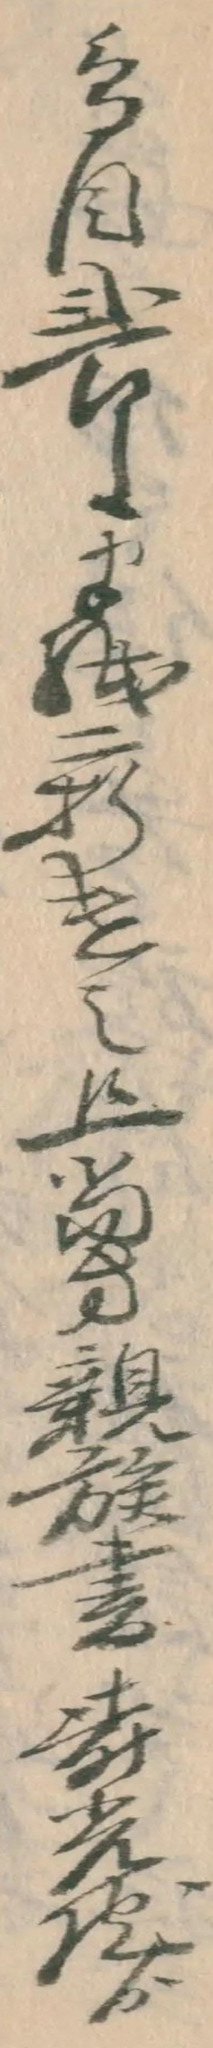鳥目弐百匁半紙二折遣之且當方親族書壽光院ゟ
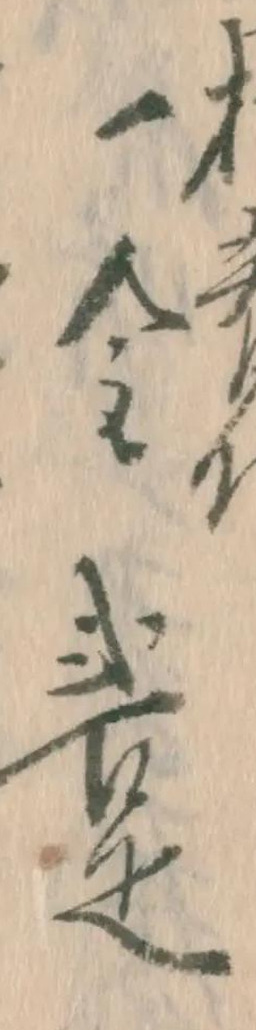一金弐百疋
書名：賀茂社記録. 第67冊
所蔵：国立国会図書館 National Diet Library, JAPAN
